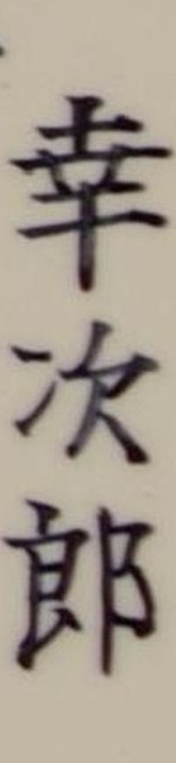幸次郎
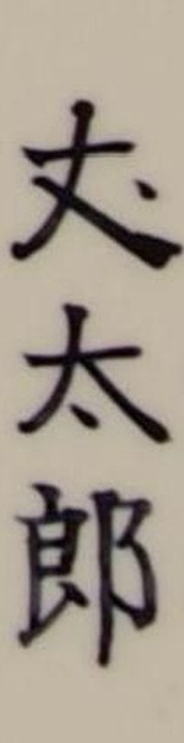丈太郎
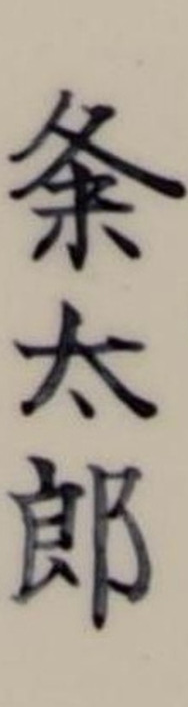粂太郎
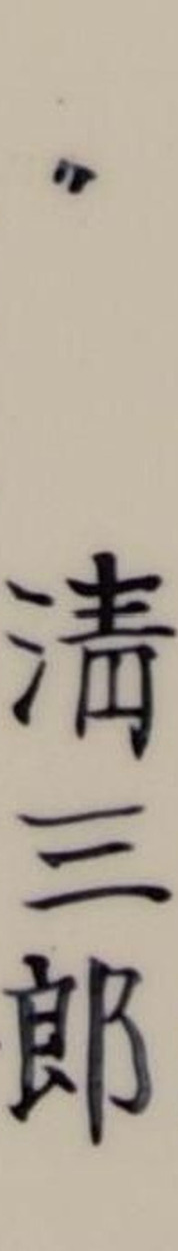清三郎
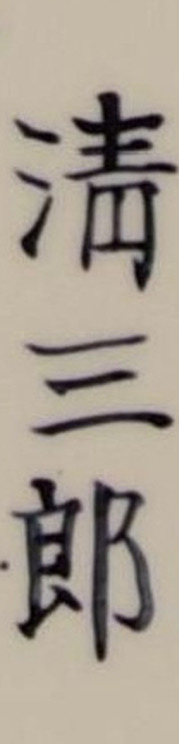清三郎
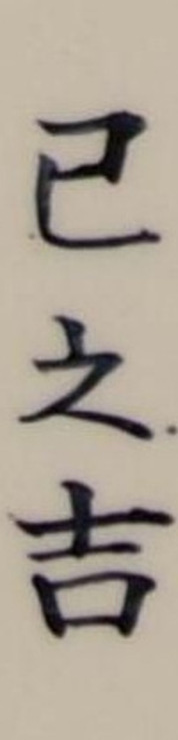巳之吉
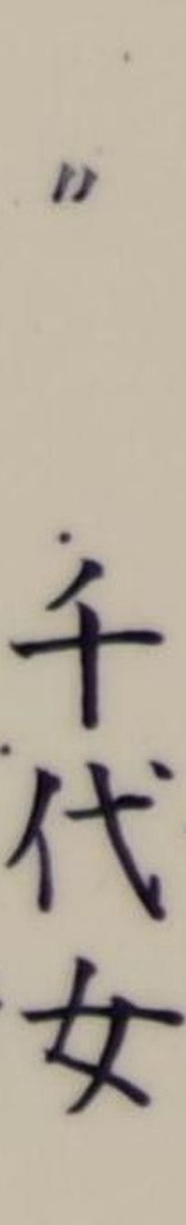千代女
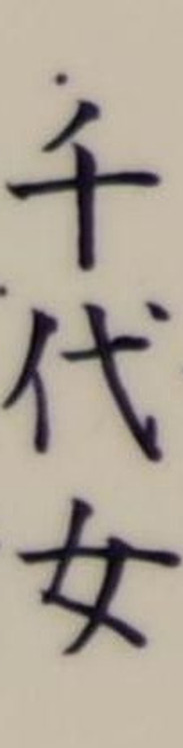千代女
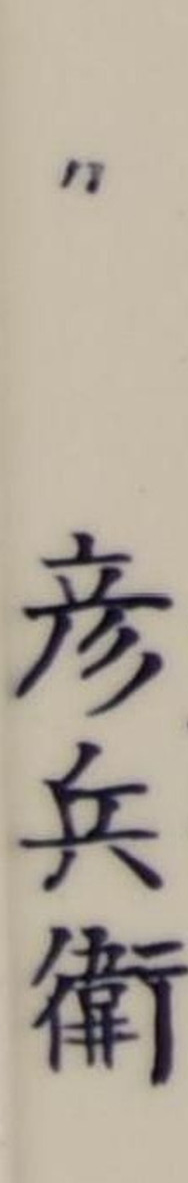彦兵衛
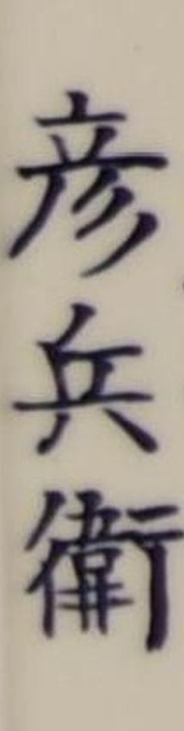彦兵衛

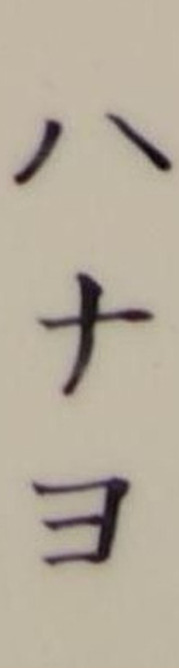ハナヨ
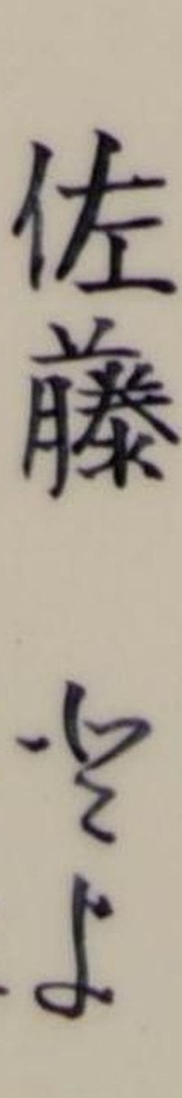佐藤とよ
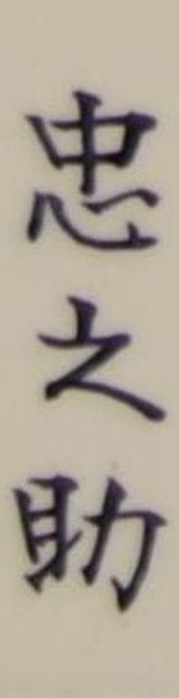忠之助

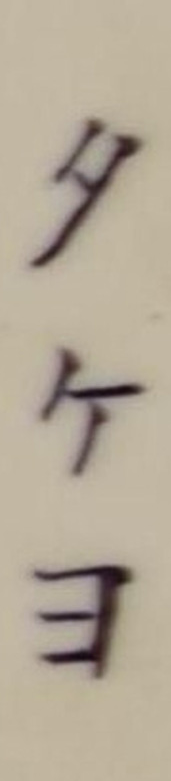タケヨ
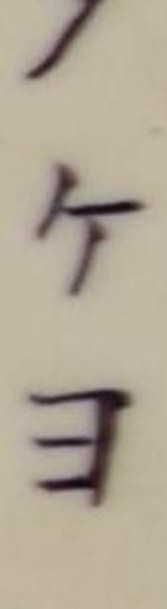タケヨ
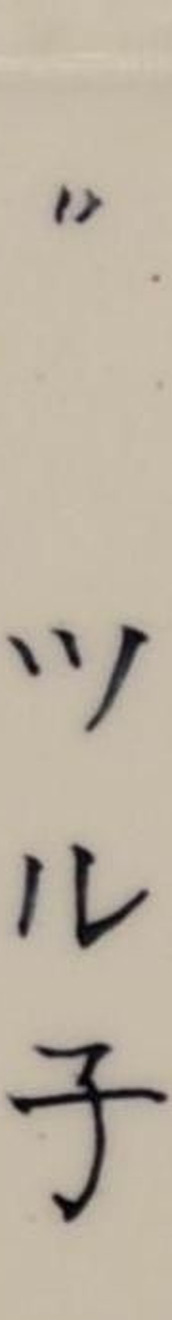ツル子
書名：E~L
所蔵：高野山金剛峯寺
